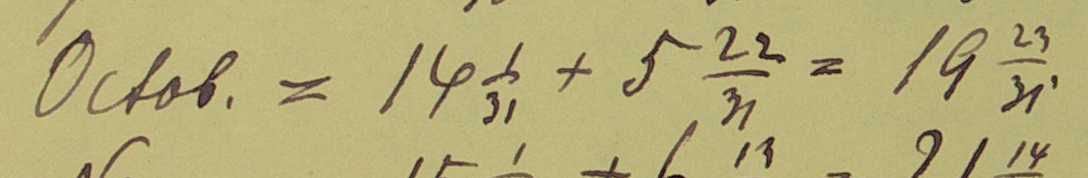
Octob. = 14 1/31 + 5 22/31 = 19 23/31
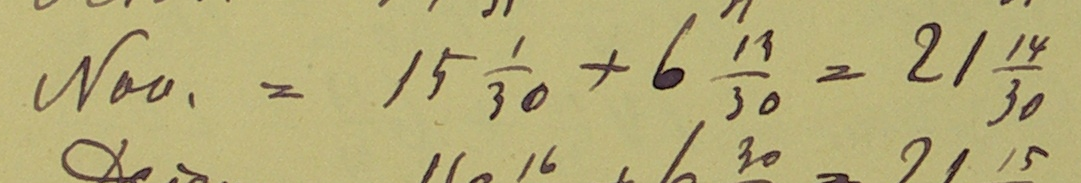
Novem. = 15 16/30 + 6 13/30 = 21 14/30
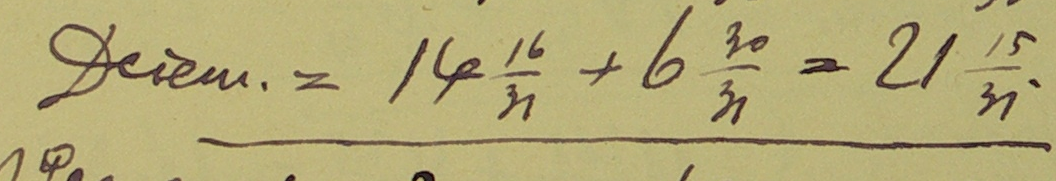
Decem. = 14 16/31 + 6 30/31 = 21 15/31
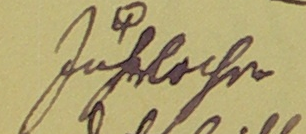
Jahres-
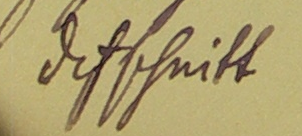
Durchschnitt
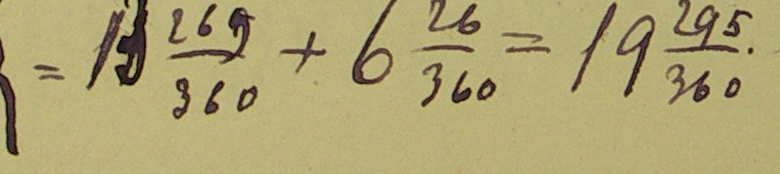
= 13 269/360 + 6 26/360 = 19 295/360
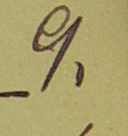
9
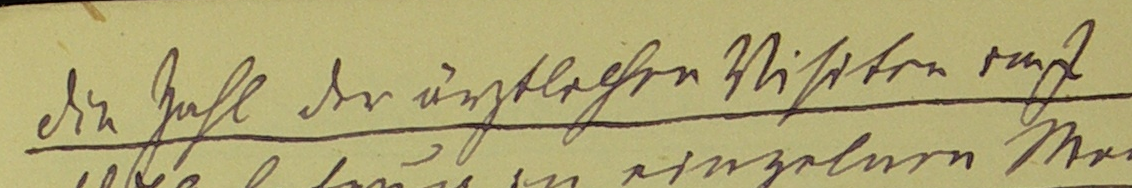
Die Zahl der ärztlichen Visiten im Jahr
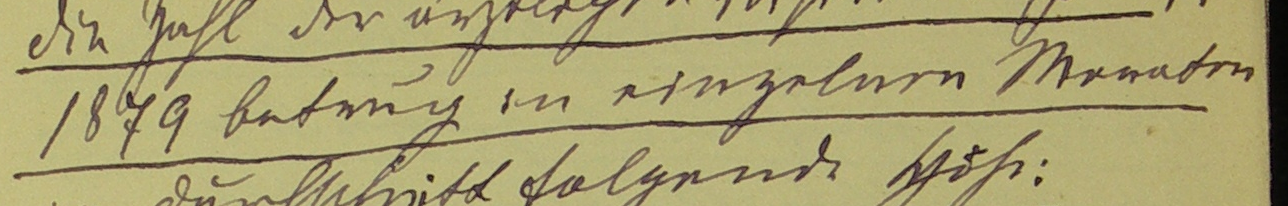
1879 betrug in einzelnen Monaten
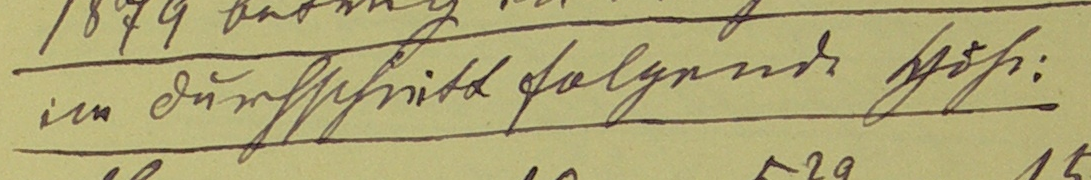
im Durchschnitt folgende Höhe:
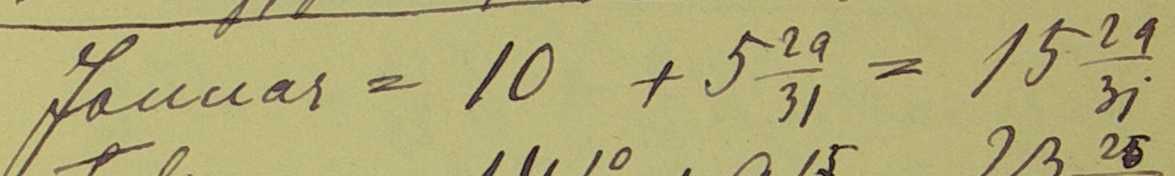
Januar = 10 + 5 29/31 = 15 29/31
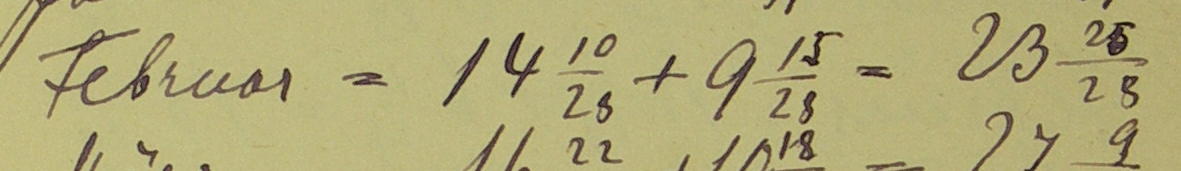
Februar = 14 10/28 + 9 15/28 = 23 25/28
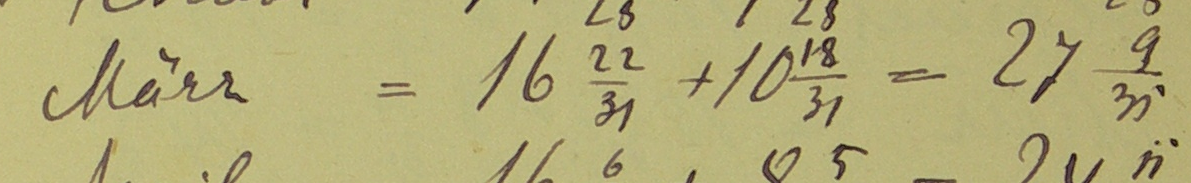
März = 16 22/31 + 10 18/31 = 27 9/31
